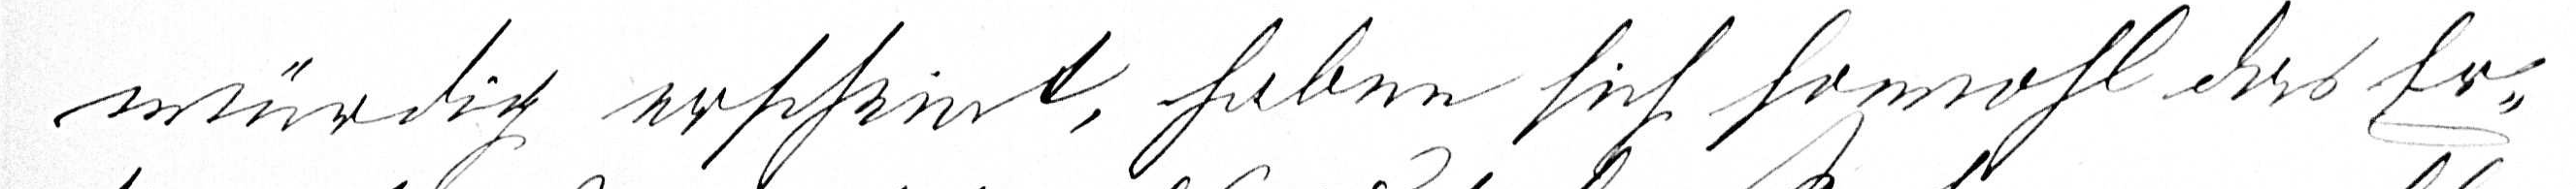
würdig erscheint, haben sich sowohl das Er¬
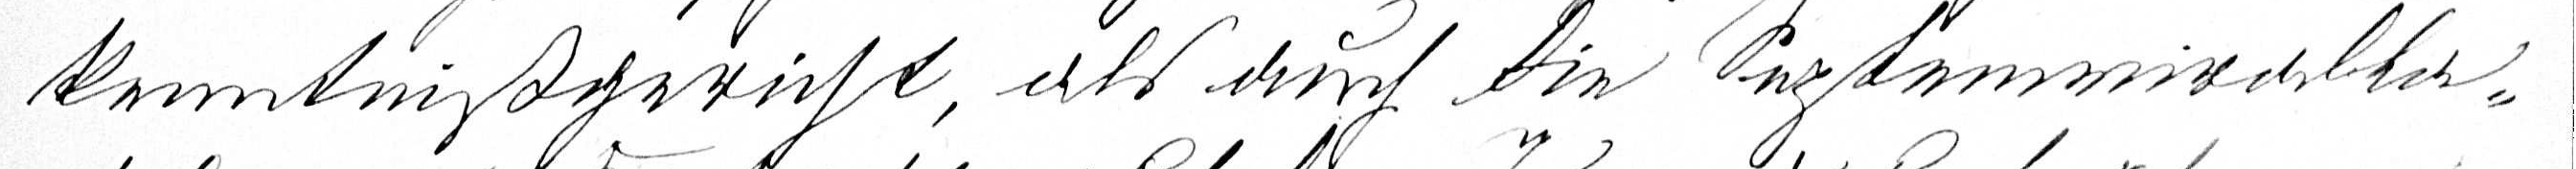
kenntnißgericht, als auch die Septemviralta¬
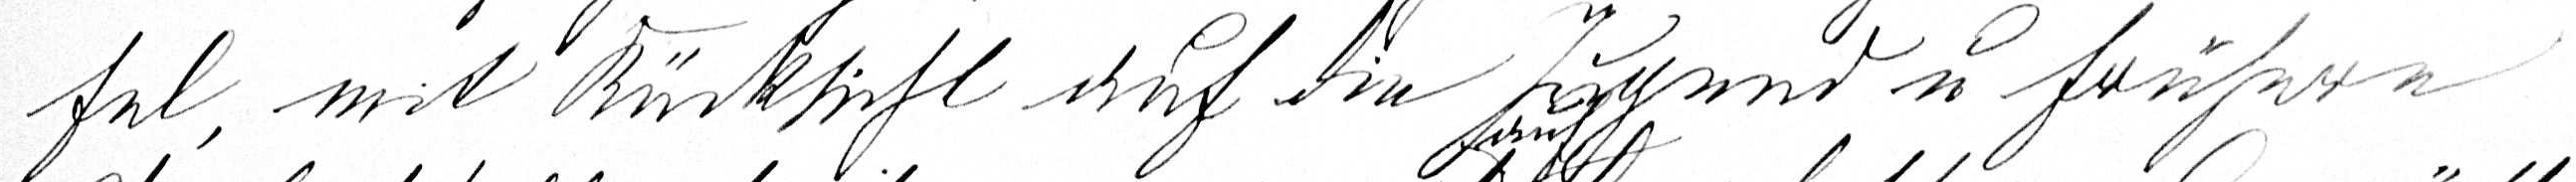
fel, mit Rücksicht auf die Jugend u. frühere
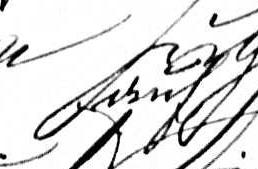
auch
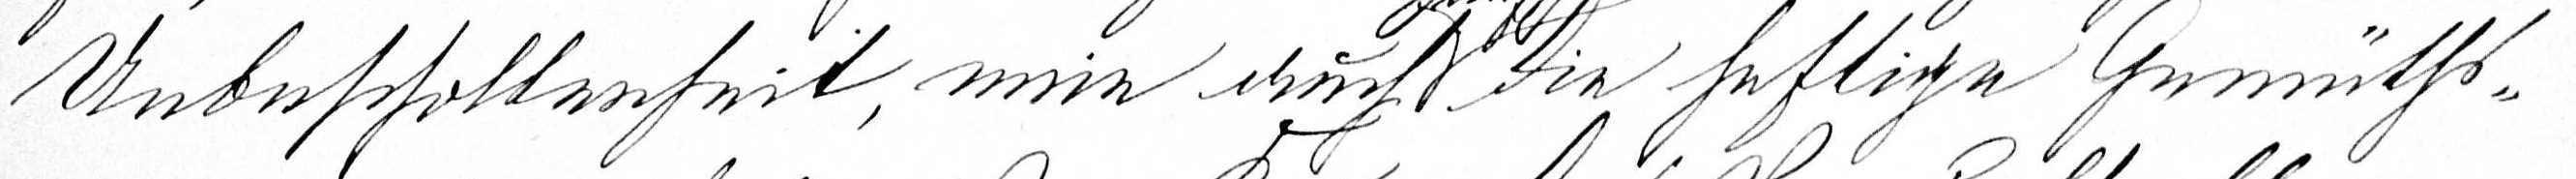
Unbescholtenheit, eine auf die heftige Gemüths¬
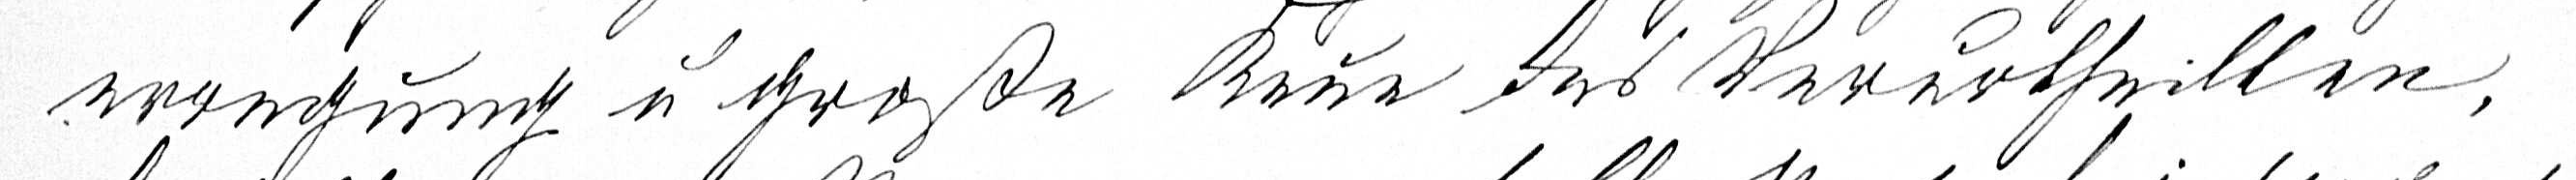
erregung u. große Reue des Verurtheilten,
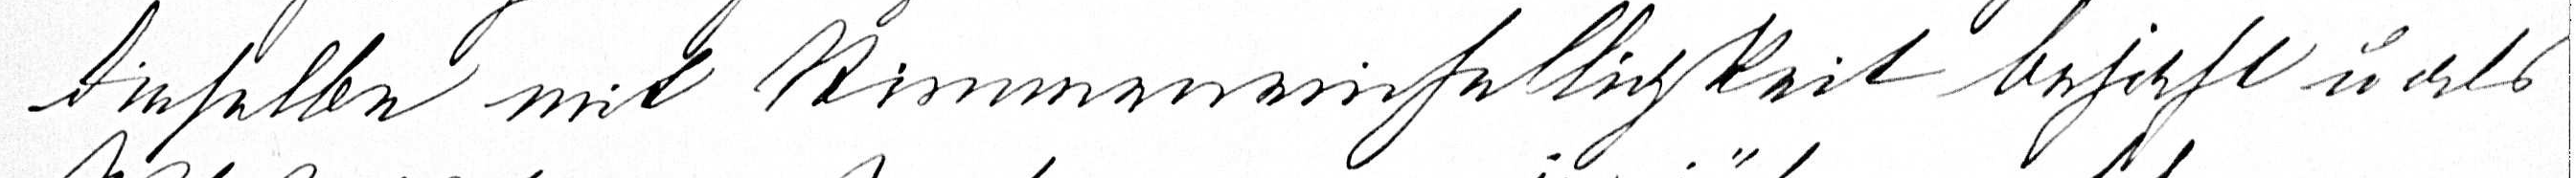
dieselbe mit Stimmeneinhelligkeit bejaht u. als
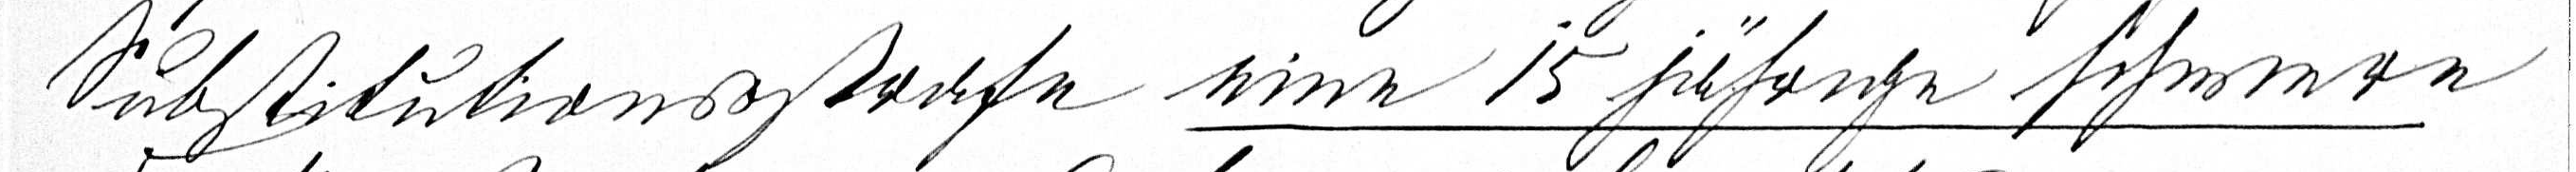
Substitutionsstrafe eine 15 jährige schwere
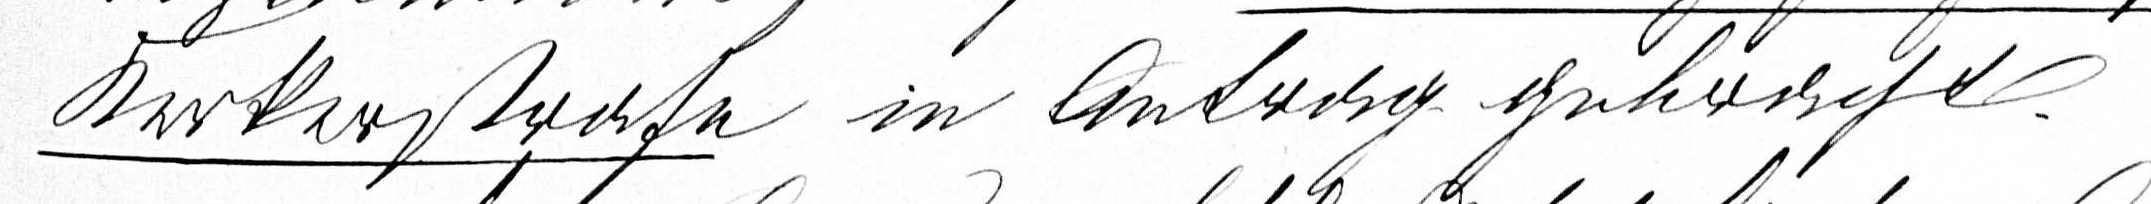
Kerkerstrafe in Antrag gebracht.
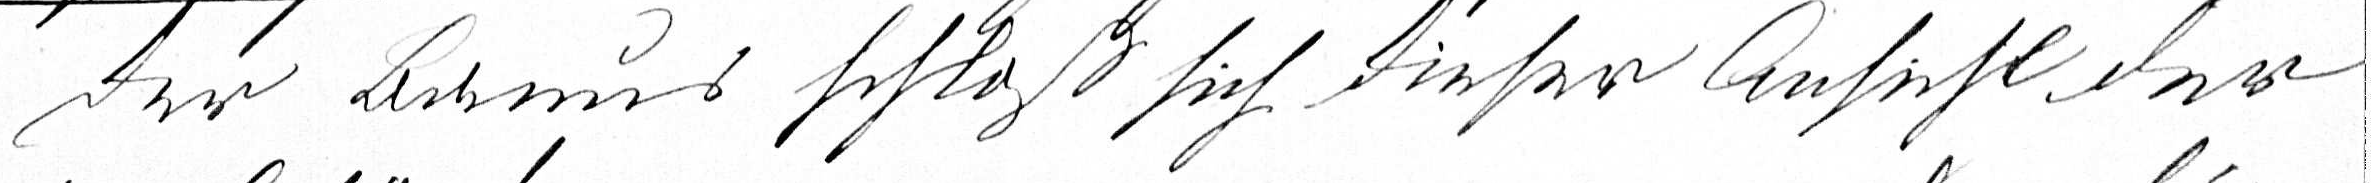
Der Banus schloß sich dieser Ansicht der
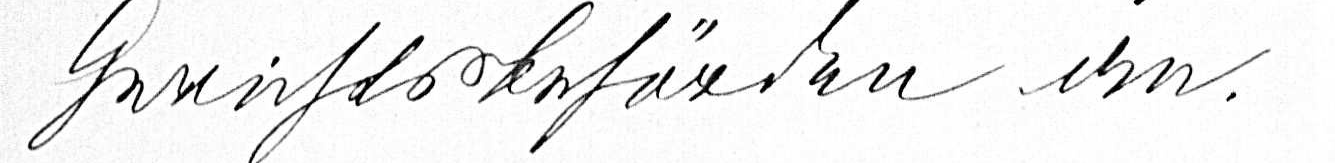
Gerichtsbehörde an.
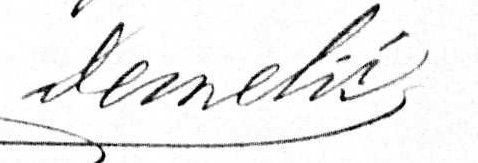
Demelić
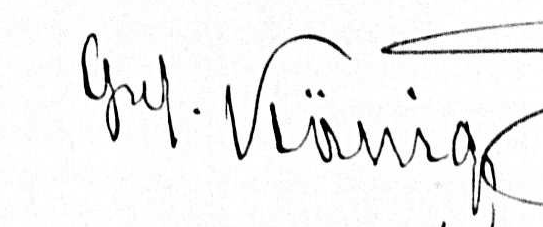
Ges. König
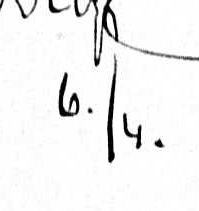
6/4
